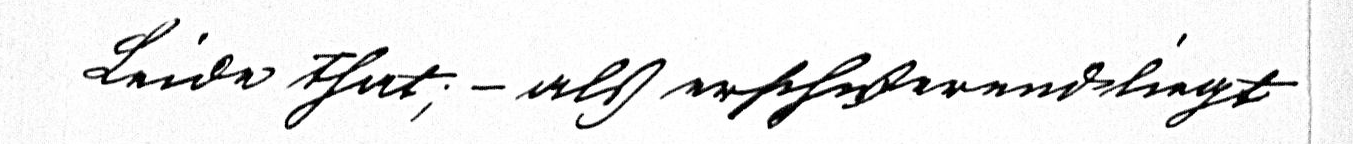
Leide that; - als erschwerend liegt
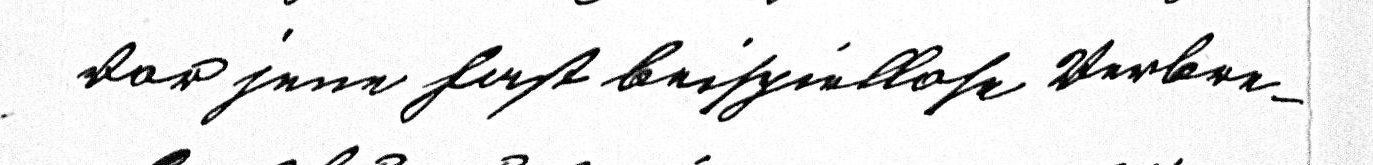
vor jene fast beispiellose Verbre¬
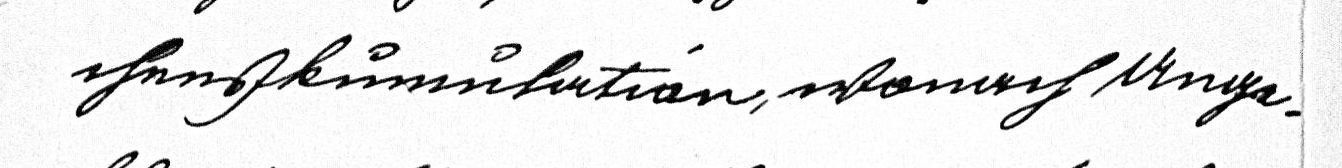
chenskumulation, wonach Ange¬
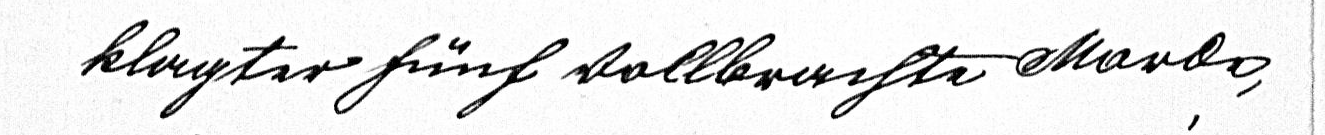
klagter fünf vollbrachte Morde,
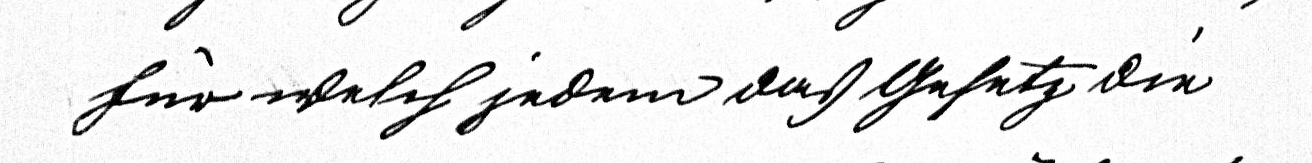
für welch jedem das Gesetz die
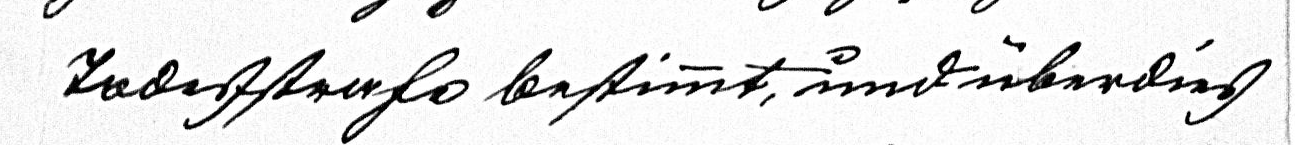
Todesstrafe bestimmt, und überdies
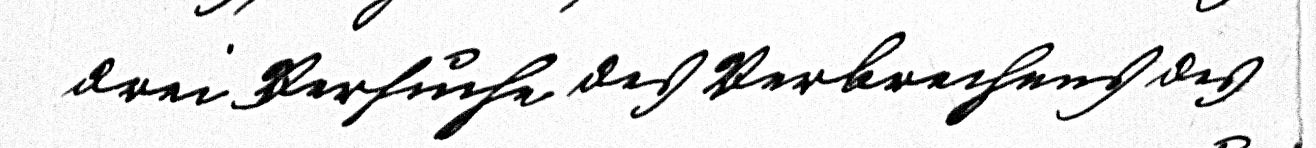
drei Versuche des Verbrechens des
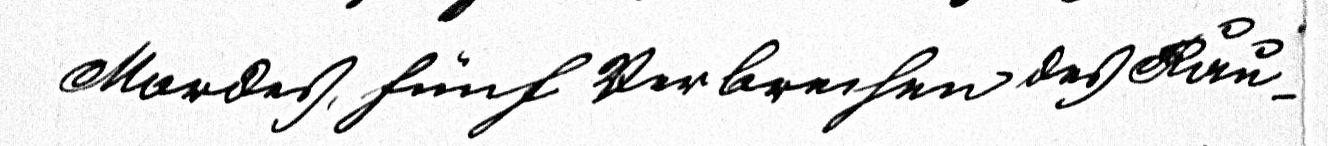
Mordes, fünf Verbrechen des Rau¬
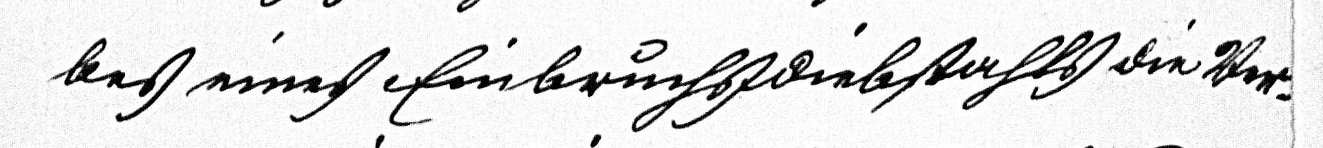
bes eines Einbruchsdiebstahls die Ver¬
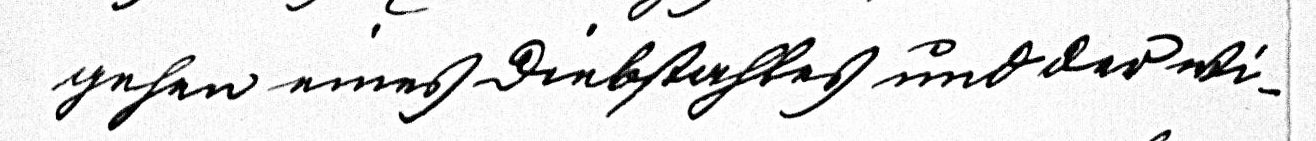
gehen eines Diebstahles und der wi¬
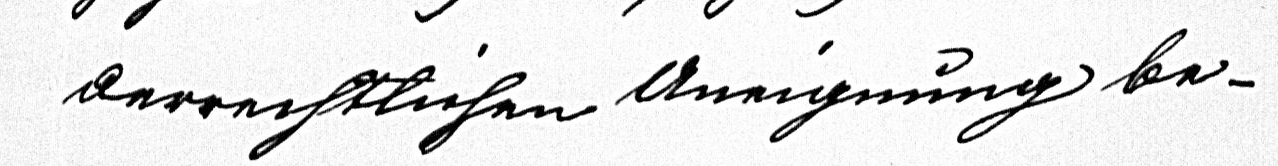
derrechtlichen Aneignung be¬
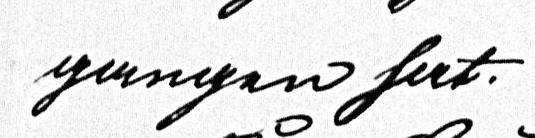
gangen hat.
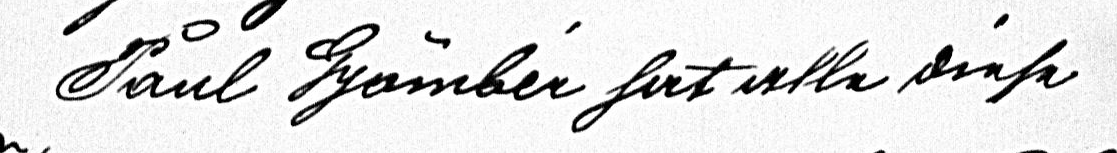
Paul Gyömbér hat alle diese
